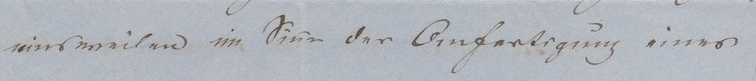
einsweilen im Sinne der Anfertigung eines
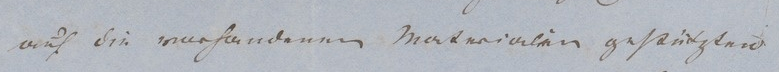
auf die vorhandenen Materialien gestützten
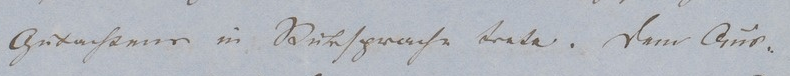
Gutachtens in Rüksprache trete. Dem Aus-
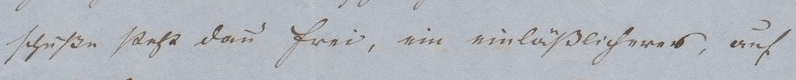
schuße steht dann frei, ein einläßlicheres, auf
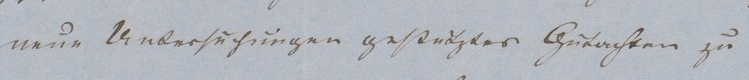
neue Untersuchungen gestüztes Gutachten zu
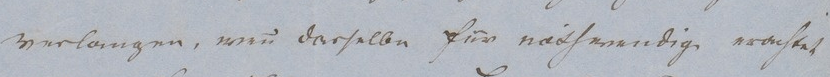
verlangen, wenn dasselbe für nothwendig erachtet
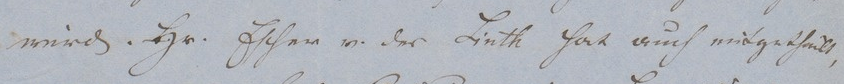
wird. Hr. Escher v. der Linth hat auch mitgetheilt,
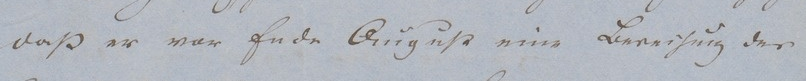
daß er vor Ende August eine Bereisung des
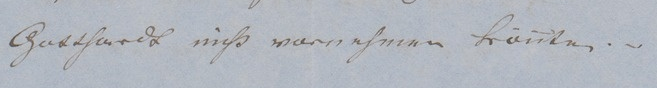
Gotthardt nicht vornehmen könnte. –
